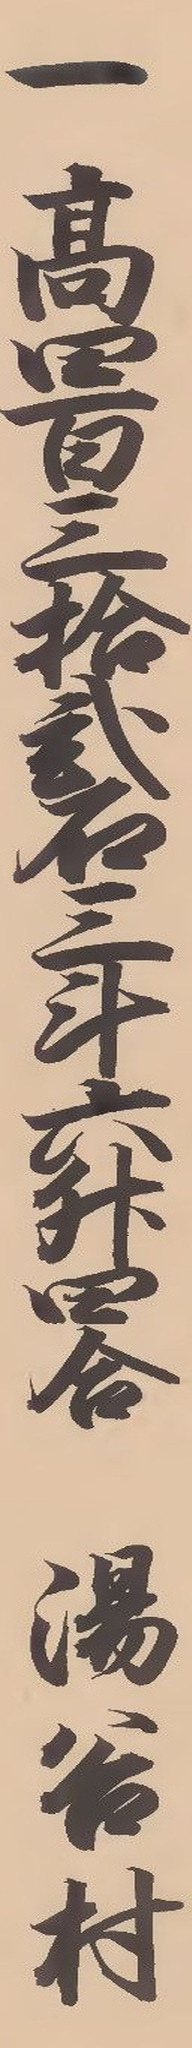一髙四百三拾弐石三斗六升四合湯谷村
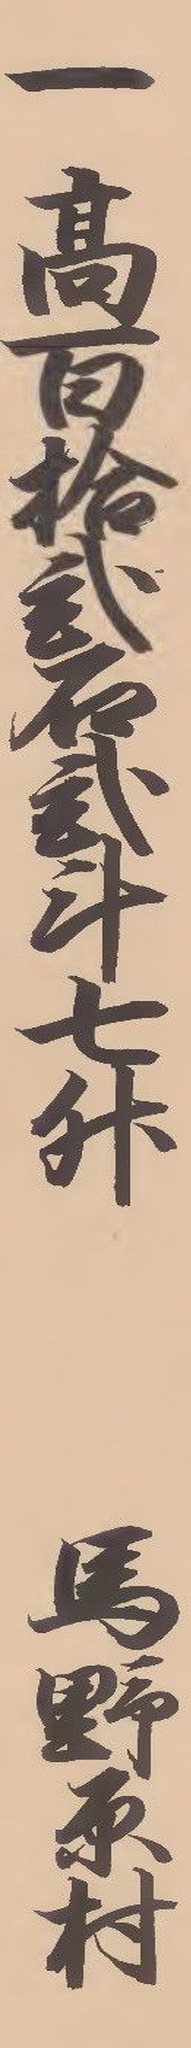一髙百拾弐石弐斗七升馬野原村
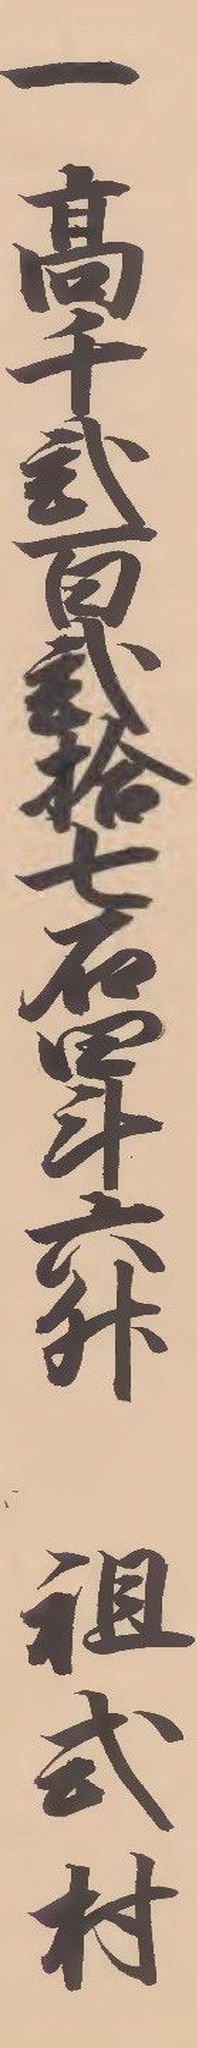一髙千弐百弐拾七石四斗六升祖式村

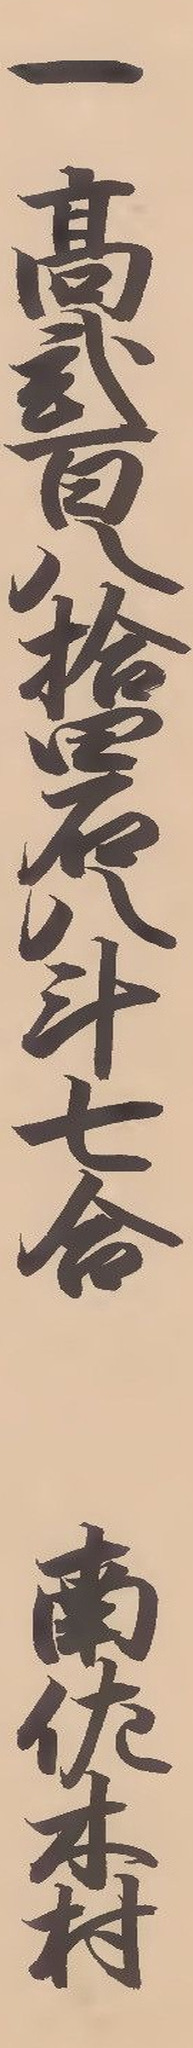一髙弐百八拾四石八斗七合南佐木村
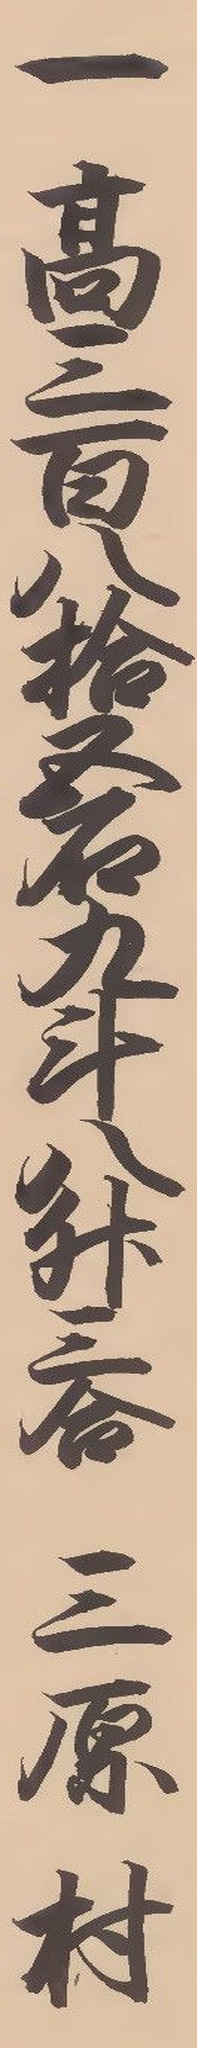一髙三百八拾五石九斗八升三合三原村
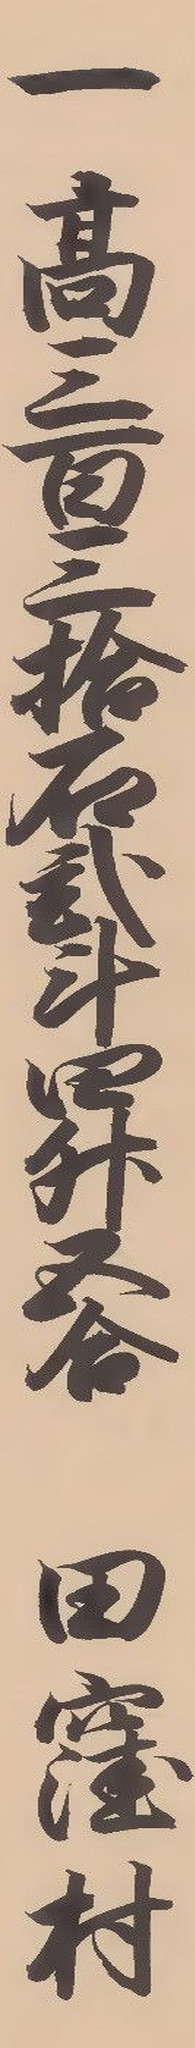一髙三百三拾石弐斗四升五合田窪村
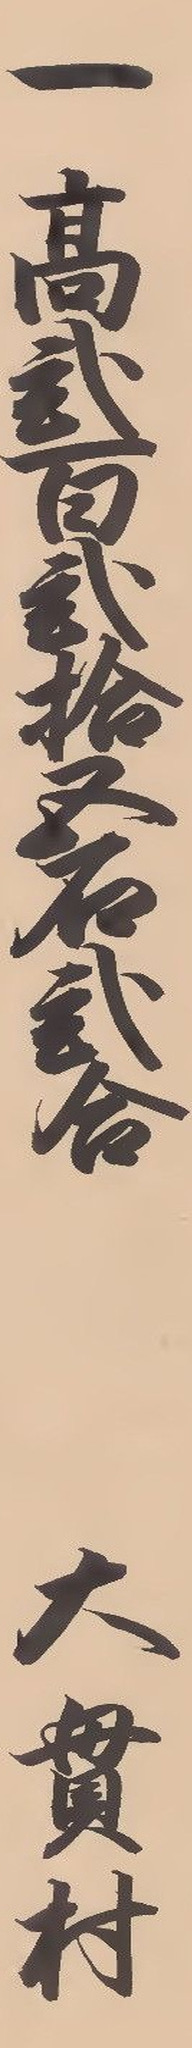一髙弐百弐拾五石弐合大貫村
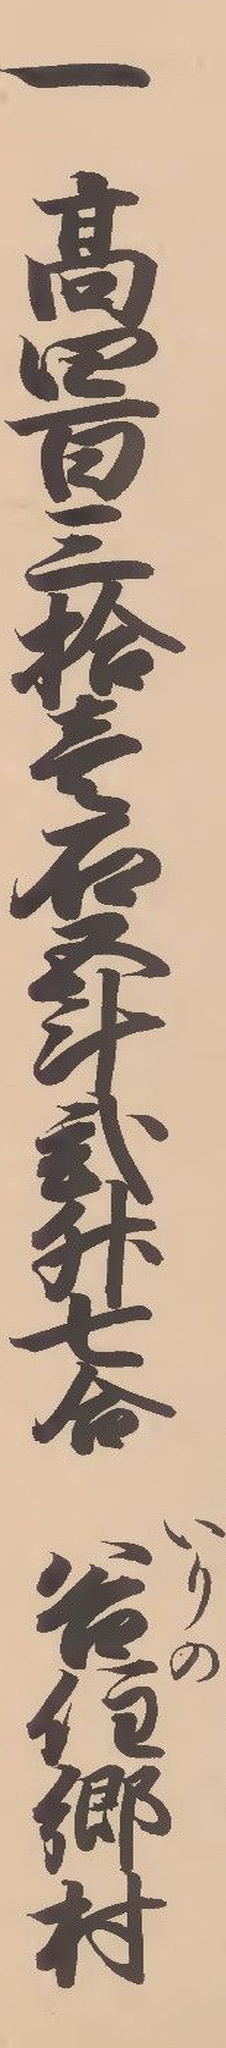一髙四百三拾壱石五斗弐升七合谷住郷村
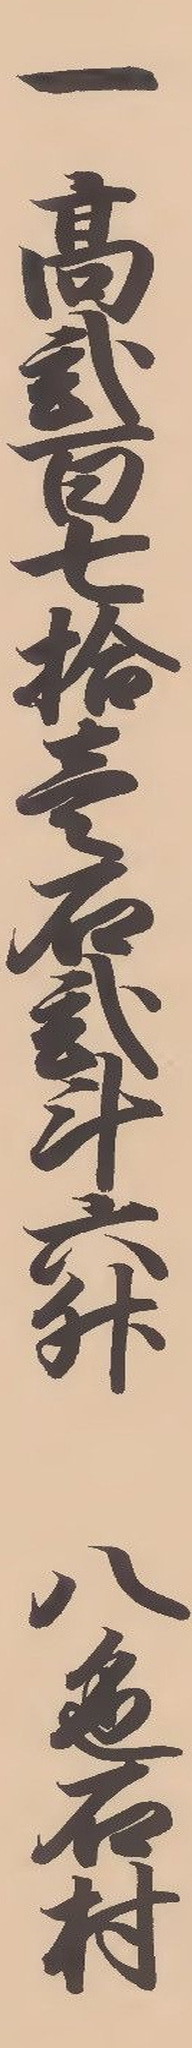一髙弐百七拾壱石弐斗六升八色石村
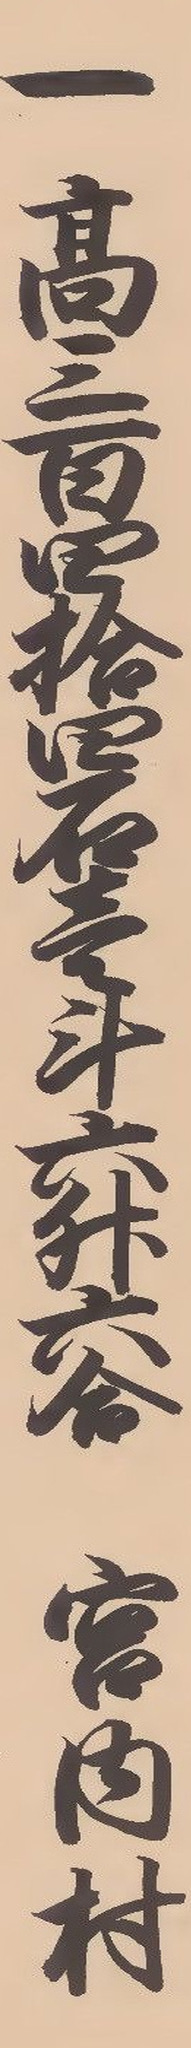一髙三百四拾四石壱斗六升六合宮内村
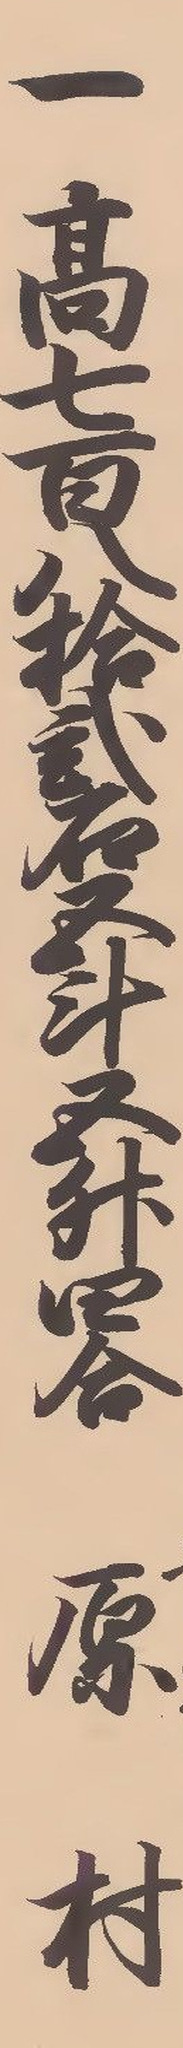一髙七百八拾弐石五斗五升四合原村

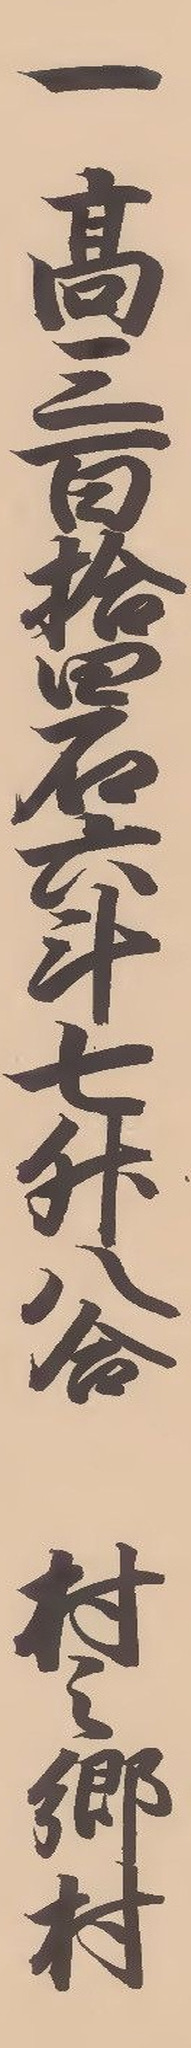一髙三百拾四石六斗七升八合村之郷村
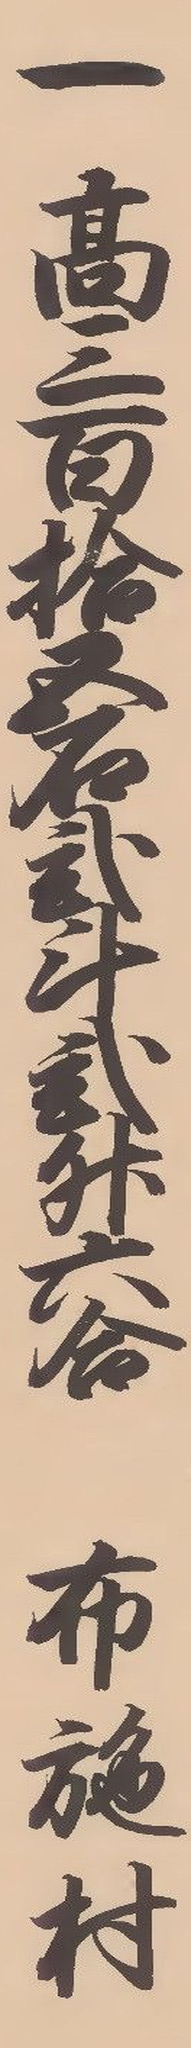一髙三百拾五石弐斗弐升六合布施村
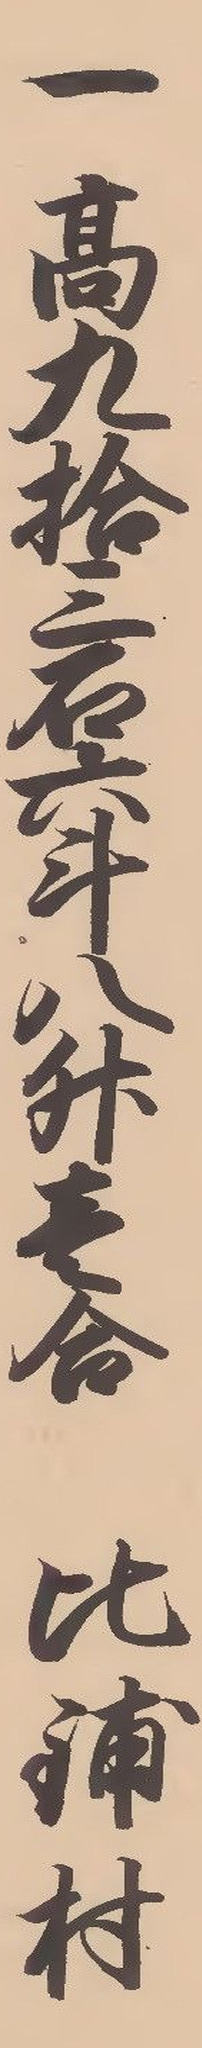一髙九拾参石六斗八升壱合比村
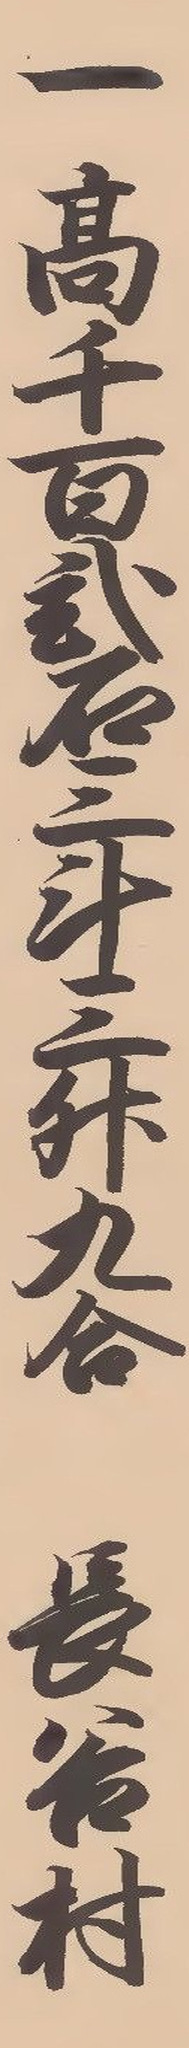一髙千百弐石三斗三升九合長谷村
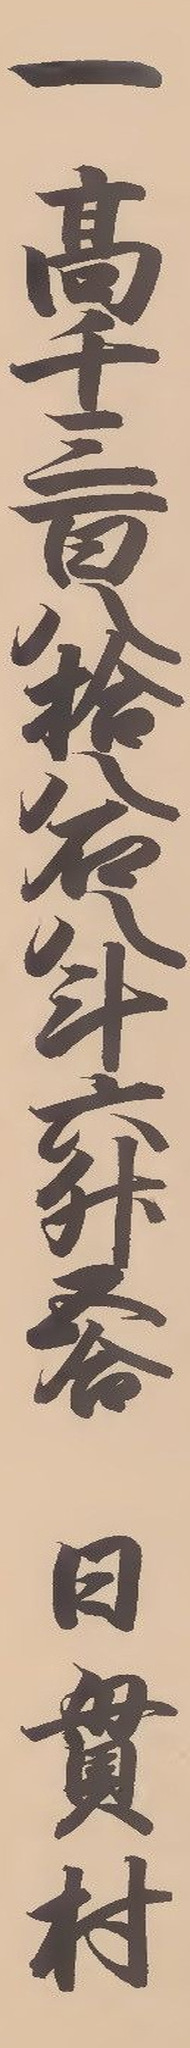一髙千三百八拾八石八斗六升五合日貫村
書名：石見国郷帳
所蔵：国立公文書館 National Archives of Japan
